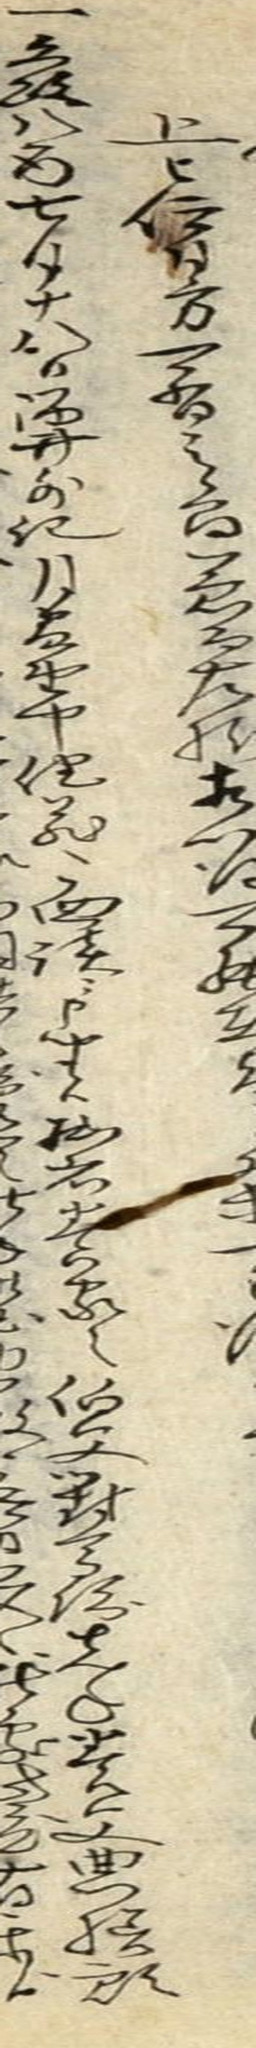一文政八酉七月十八日酒井外記月番野中健蔵へ面談ニ申聞候ハ拙者養家之伯父対馬儀先年養父典膳願
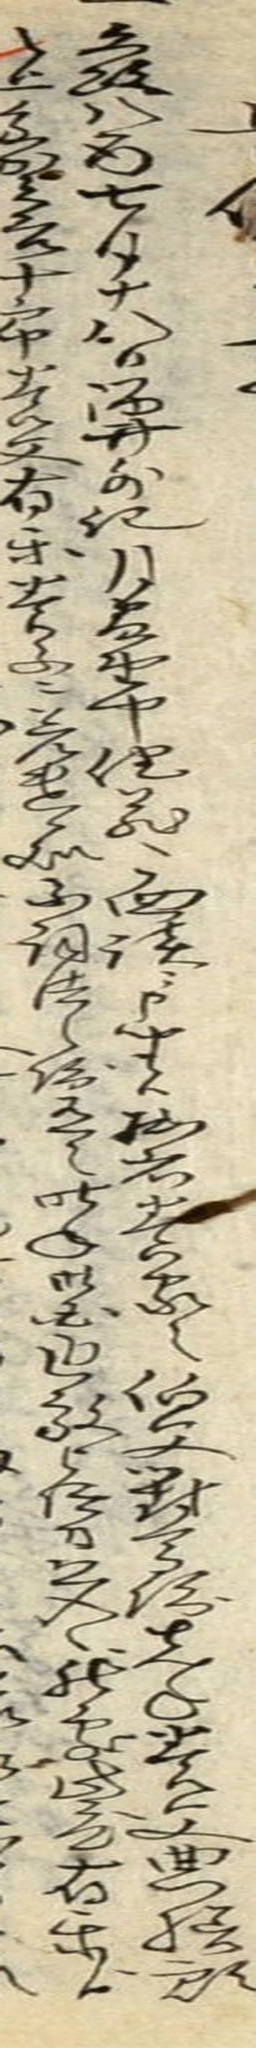之上多賀谷十郎養父有楽養子に差遣候処不調法之儀有之昨年御国追放被仰付恐入候然処此度有楽ゟ
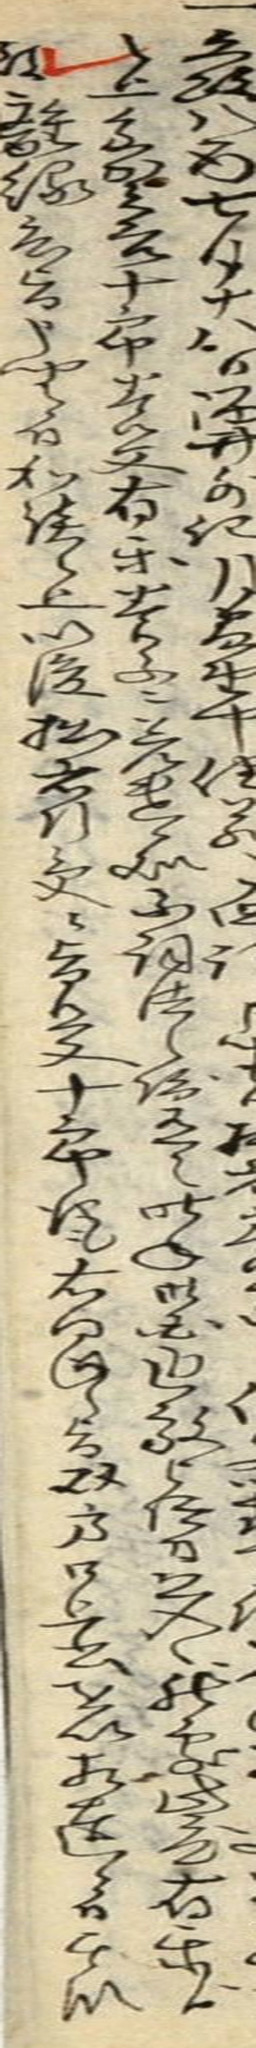致離縁度旨申聞候ニ付和談之上以後拙者引受候旨且又十郎儀も右同趣之旨双方口上書を以相達候ニ付其段

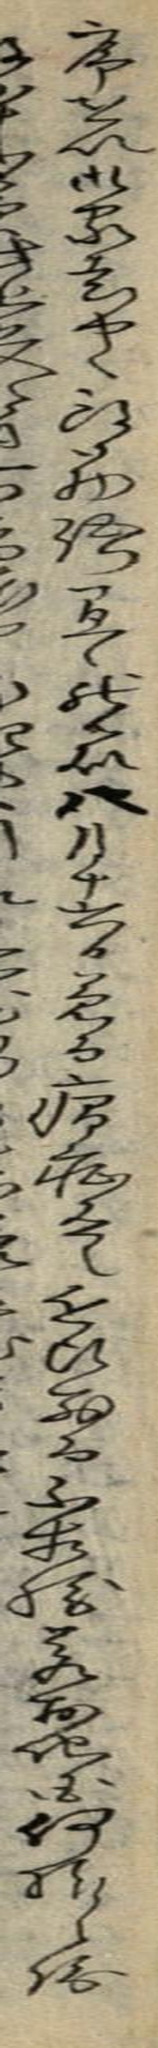序を以御家老中へ致御物語置候然る処八月十六日兼而癇病有之近頃別而不相紛若於他国何様之儀
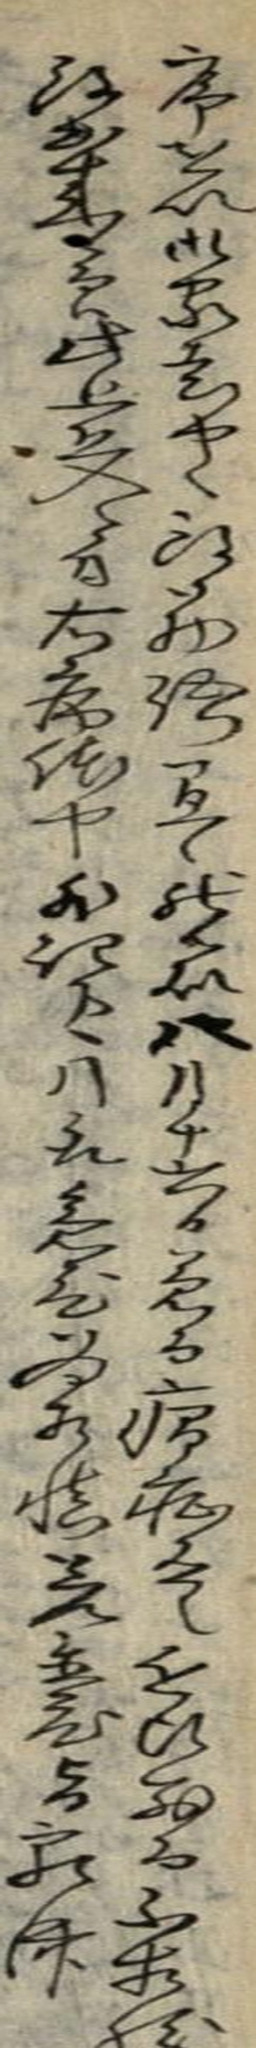致出来候而は此上恐入候に付右病体中外記方へ引取急度為相慎差置度旨願済
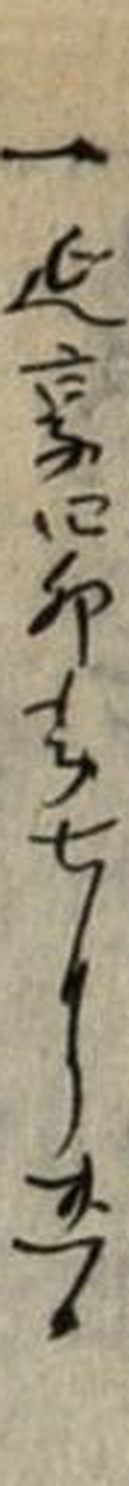一延享四卯年七月廿一日
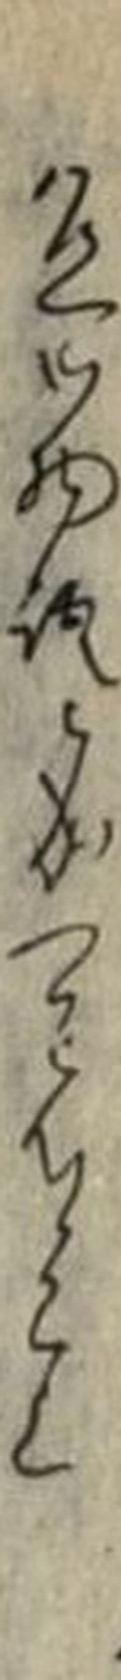置御物語被成可被下候以上
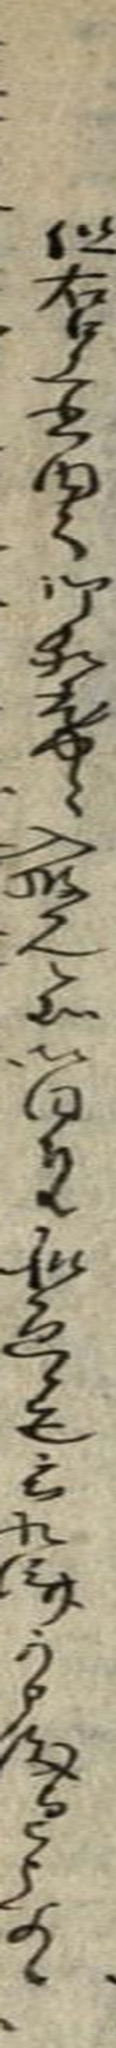但右口上書内々御家老中へ入披見候処御目付共承置候是に而相済可申儀と被申聞候
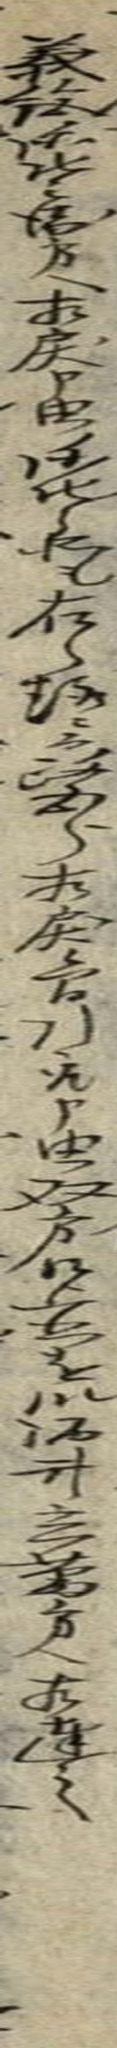義絶弥次兵衛方へ相戻申由弥次兵衛も右之趣に而政五郎相戻候間引取申由双方口上書を以酒井玄蕃方へ相達之
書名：養子縁組之部
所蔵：福井県文書館 Fukui Prefectural Archives
